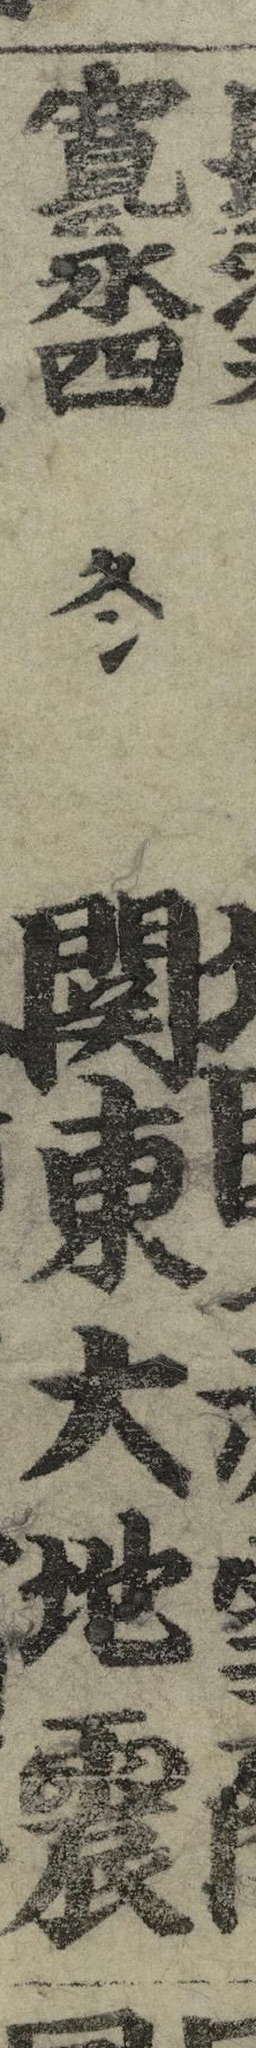寛永四冬関東大地震
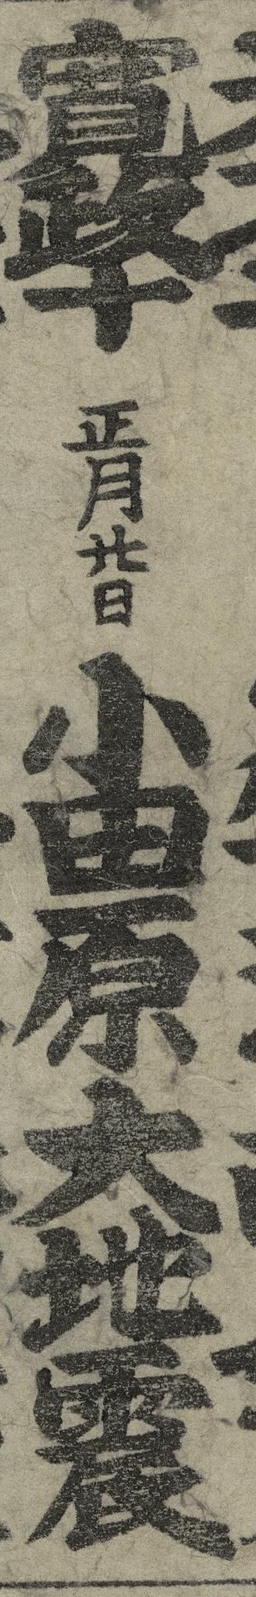寛政十正月廿日小田原大地震
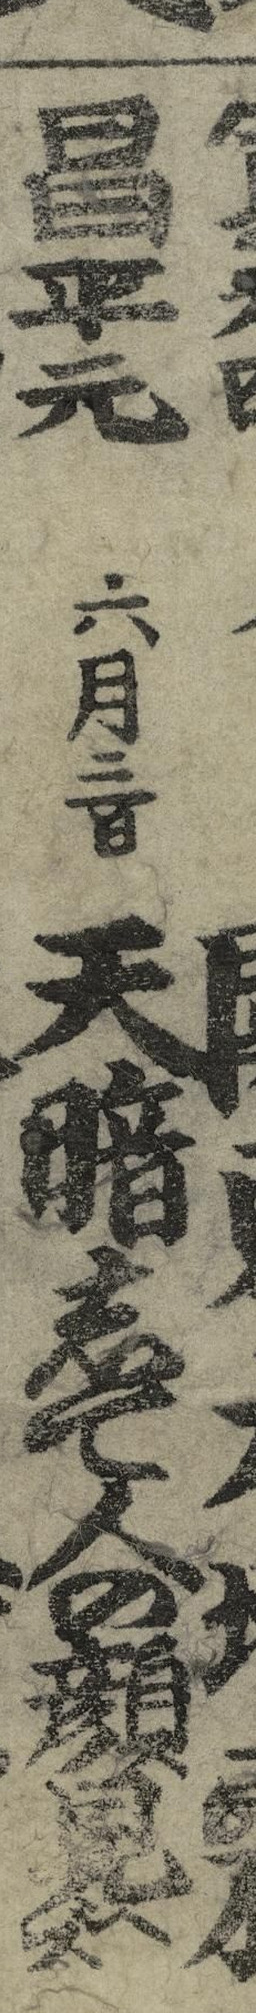昌平元六月三日天暗して人の顔見ヘズ
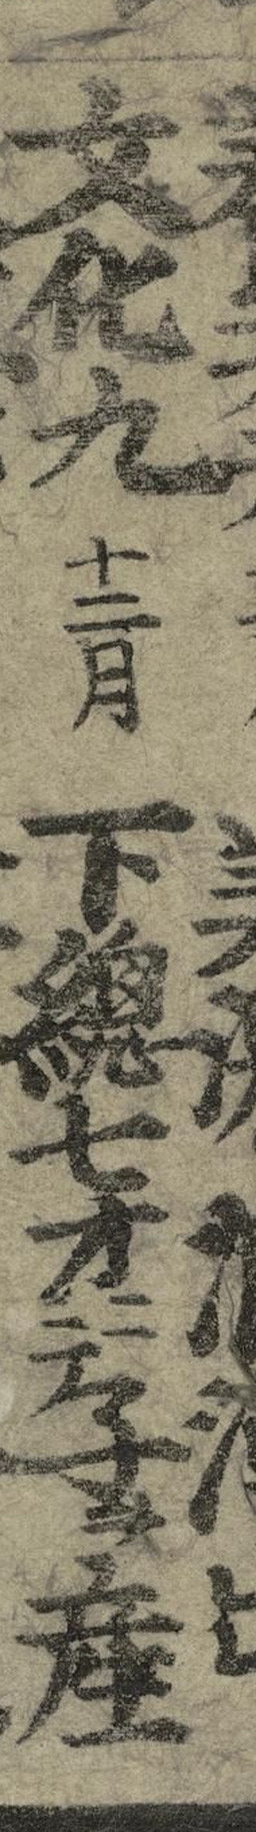文化九十二月下総七才ニテ子ヲ産
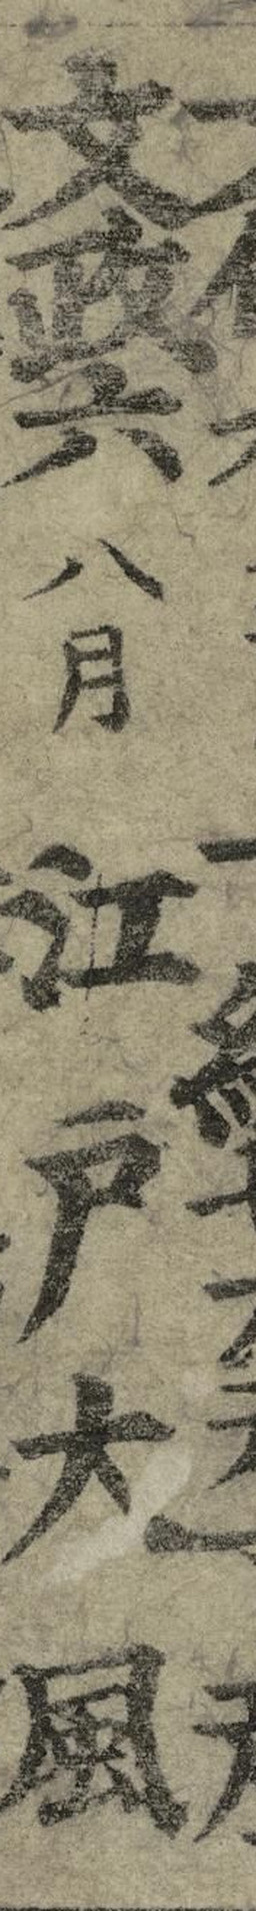文生六八月江戸大風
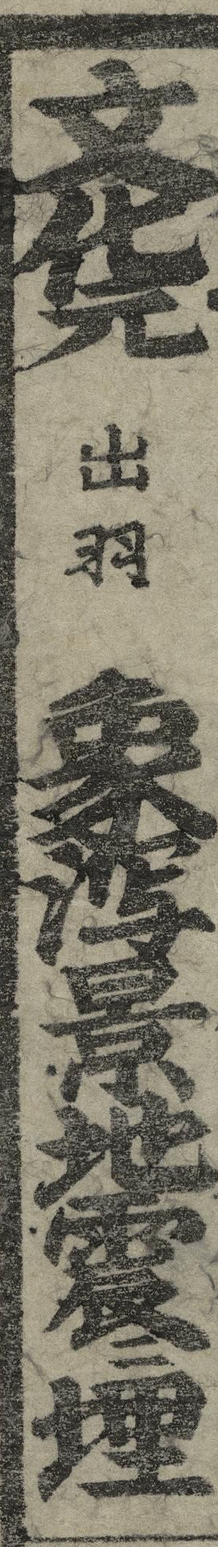文化元出羽象潟景地震ニ埋
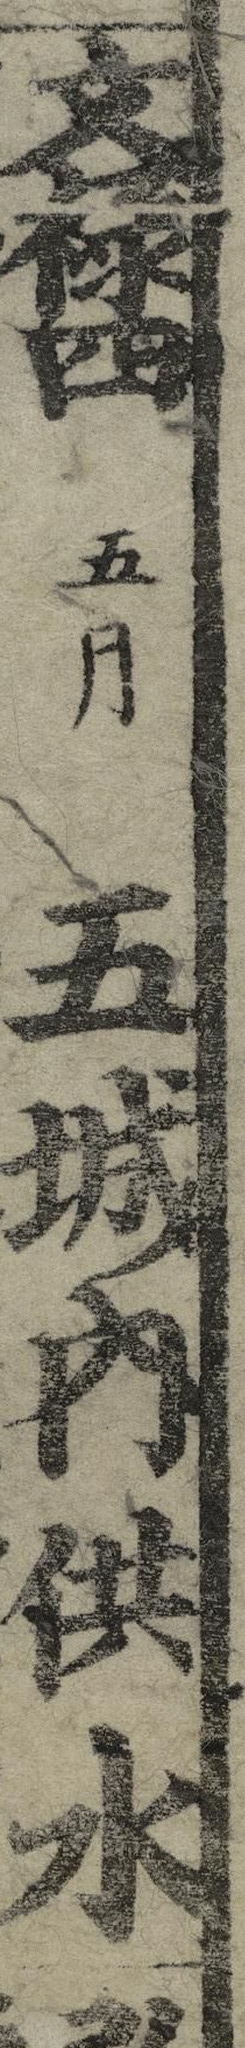文禄四五月五城内供水
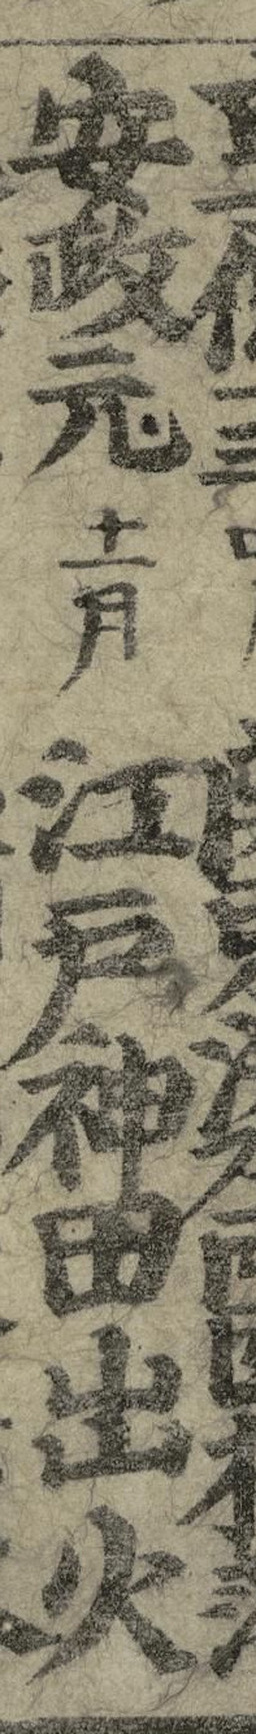安政元十一月江戸神田出火
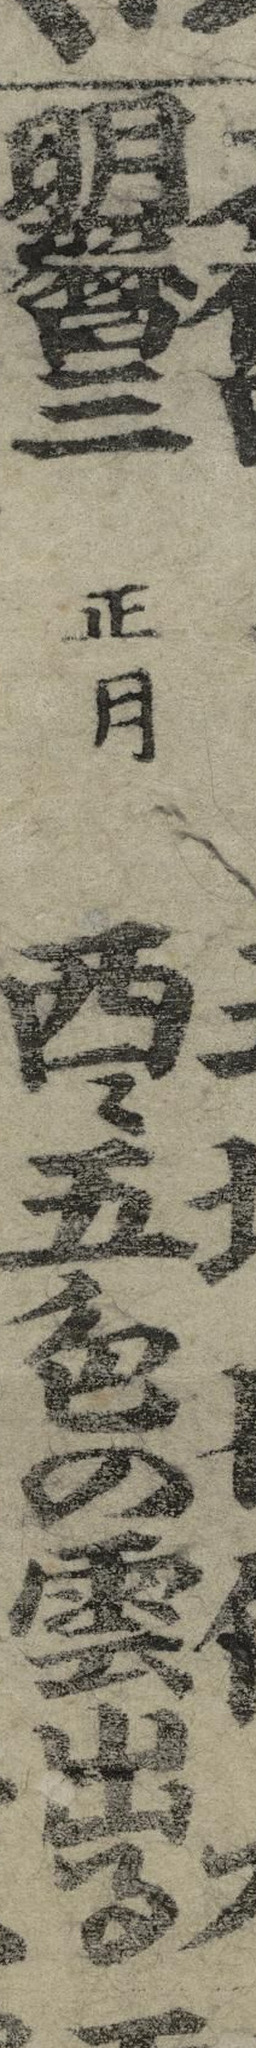明暦三正月西ニ五色の雲出る
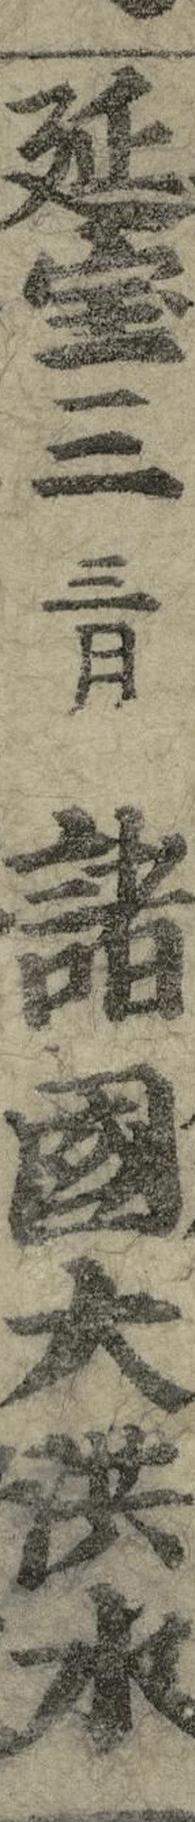延宝三三月諸国大洪水
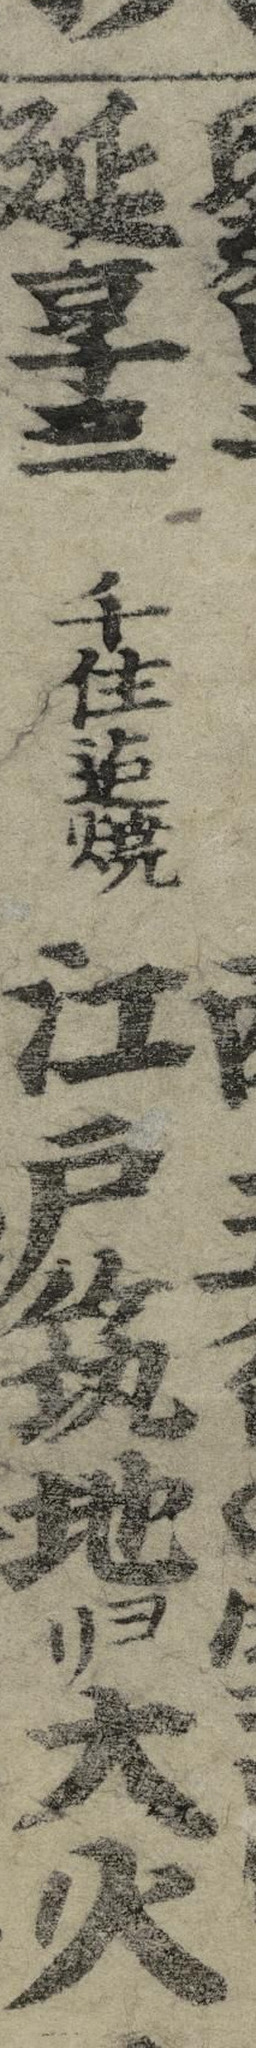延享三千住迄焼江戸筑地ヨリ大火
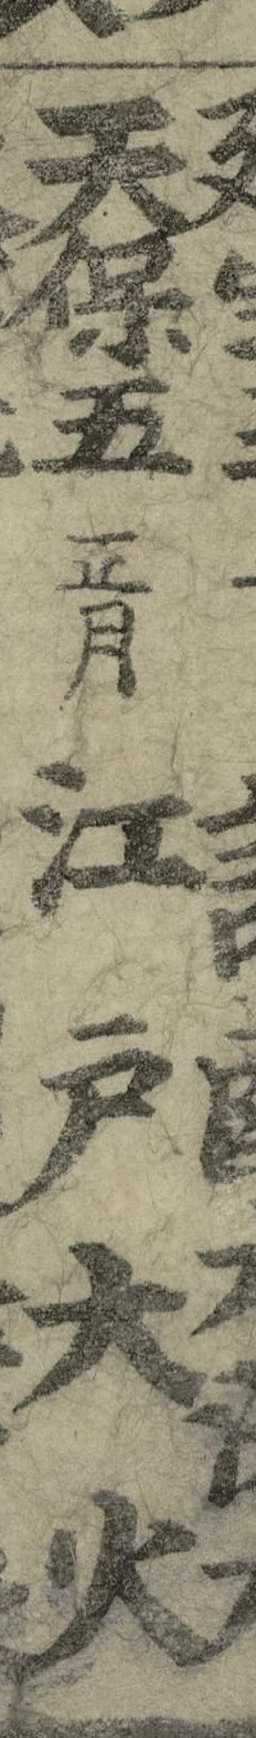天保五正月江戸大火
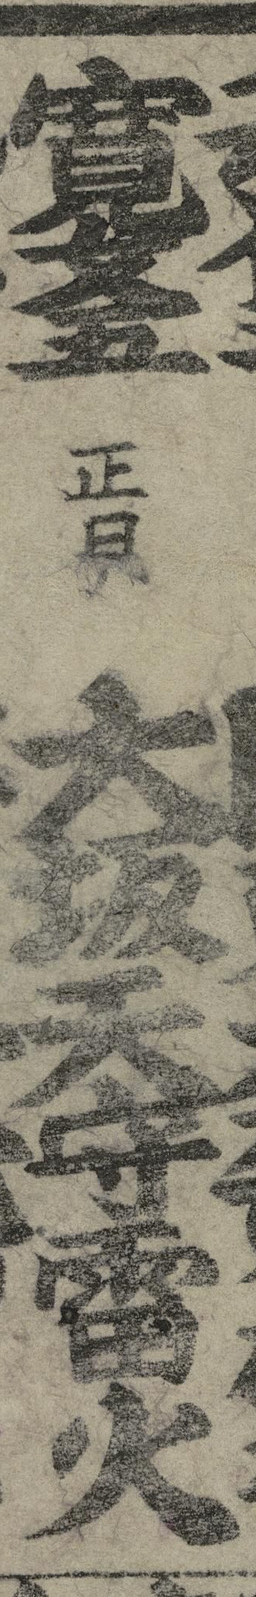寛文五正月大坂天守雷火
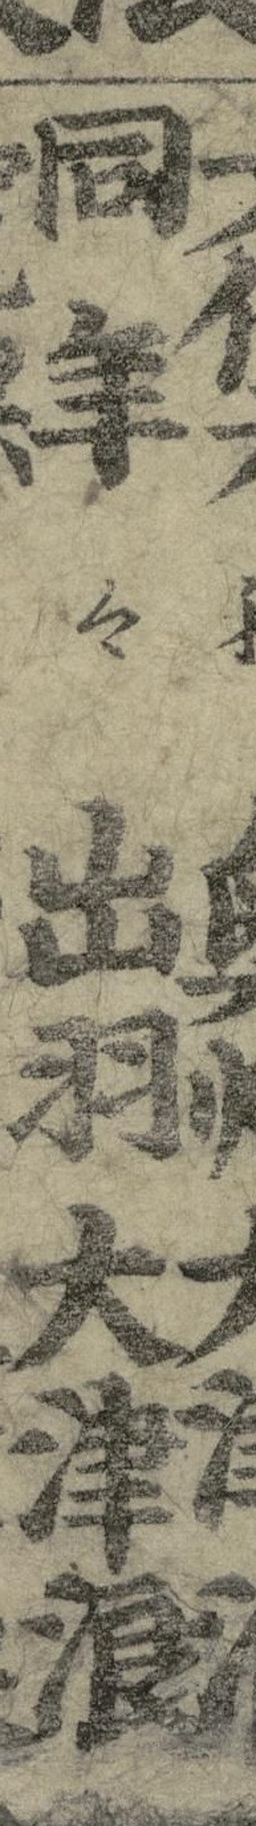同年々出羽大津浪
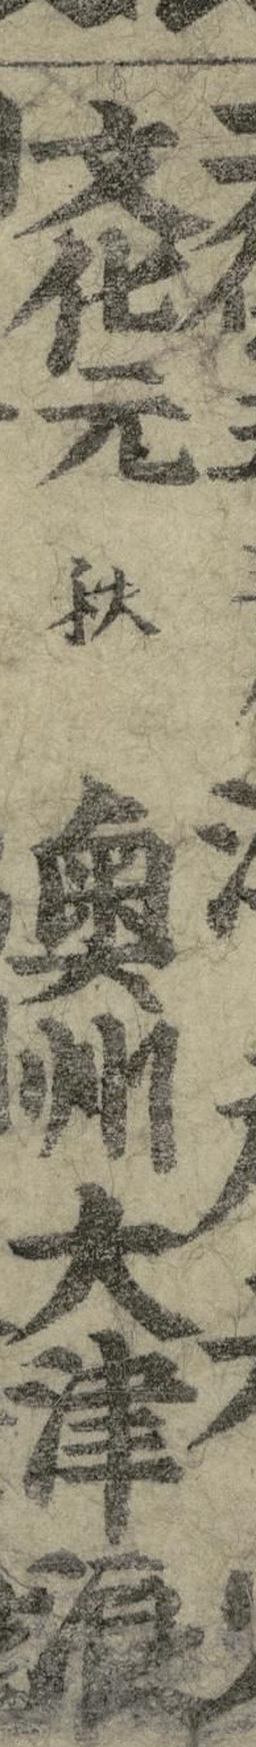文化元秋奥州大津浪
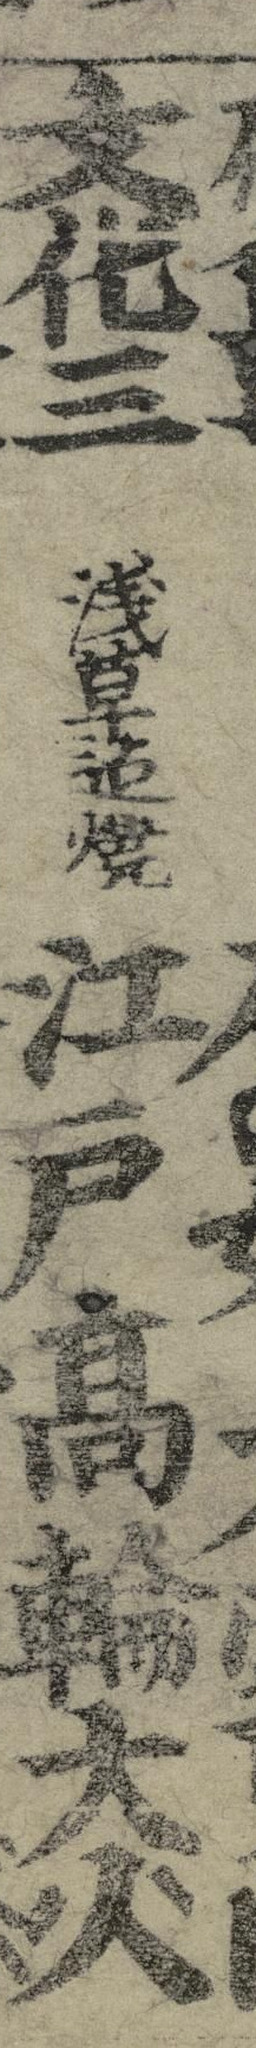文化三浅草迄焼江戸高輪大火
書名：珎事一覧
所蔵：東京大学地震研究所図書室 Earthquake Research Institute Library, The University of Tokyo, JAPAN
